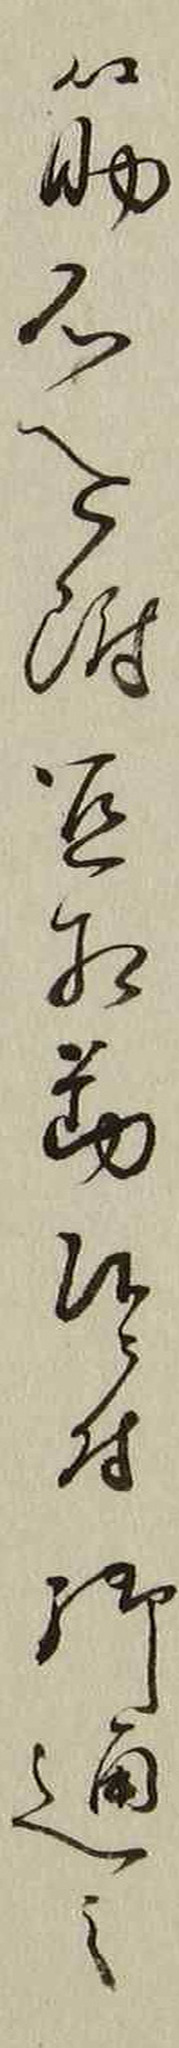筋心を附宜相勤候ニ付御通之
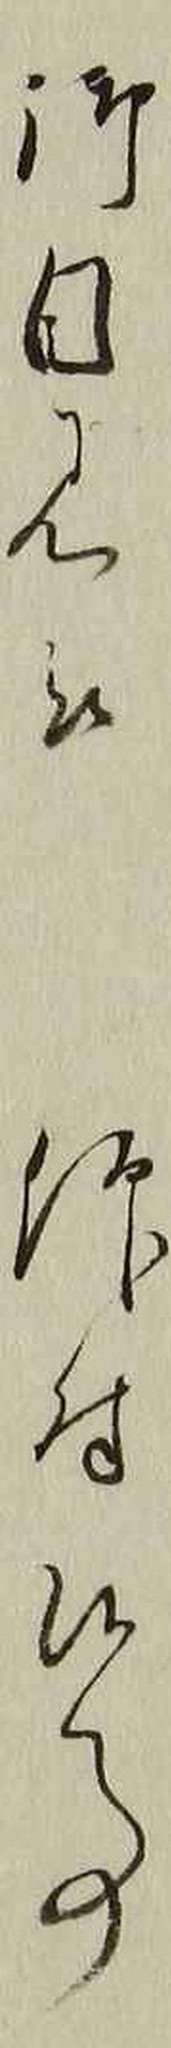御目見被仰付候事
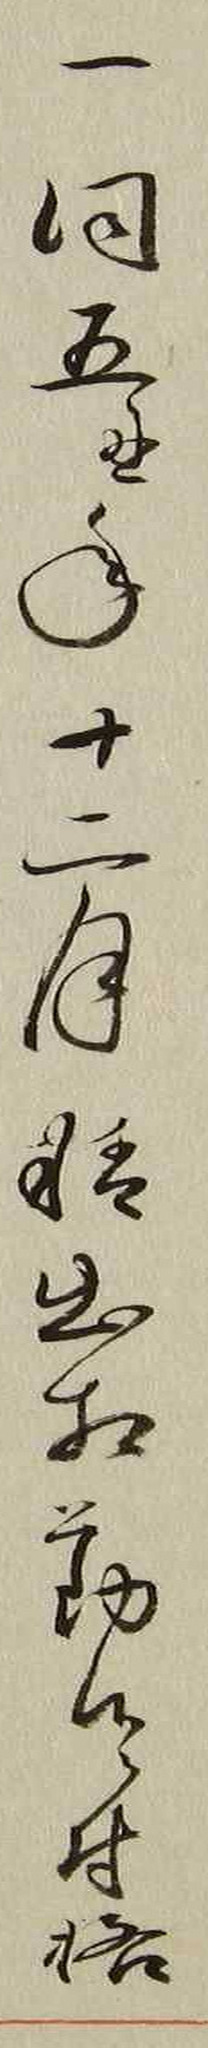一同五丑年十二月精出相勤候ニ付格
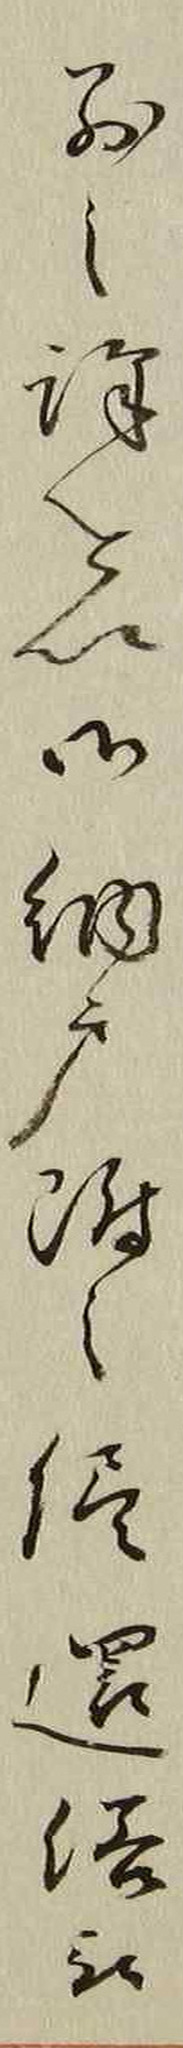別之訳を以御納戸附之儘還俗被
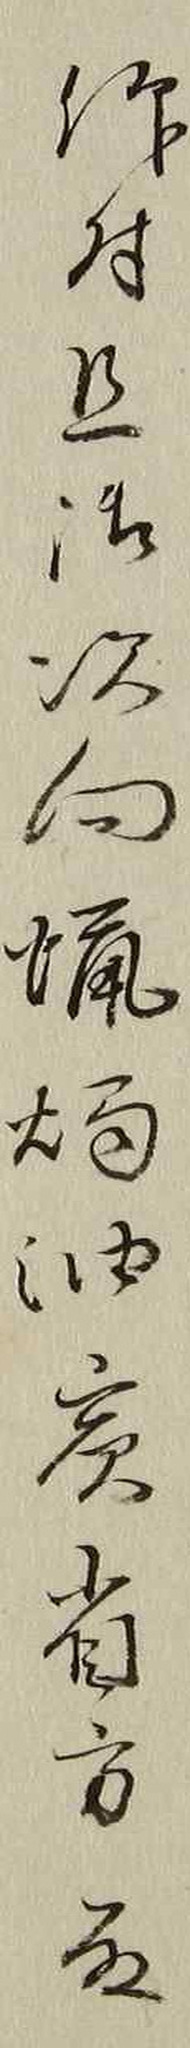仰付且御次向蝋燭油炭省方取
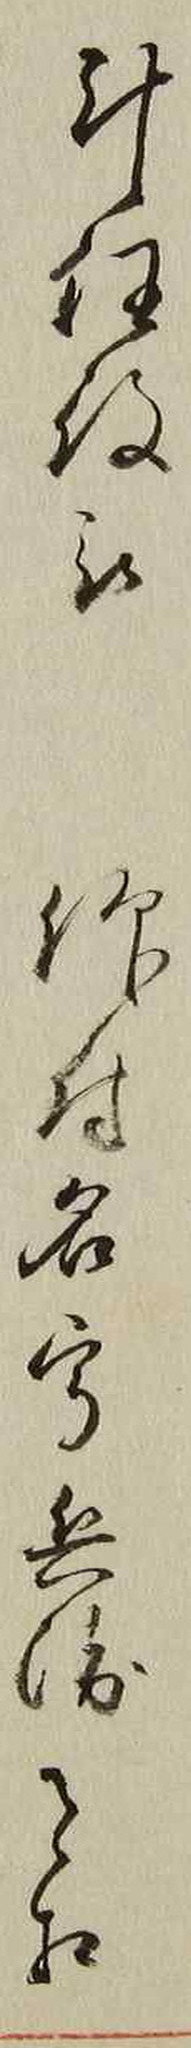計任役被仰付名宇兵衛と相
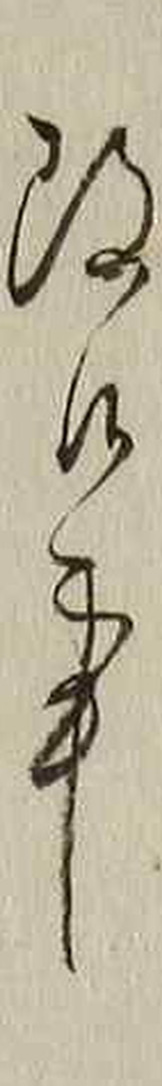改候事
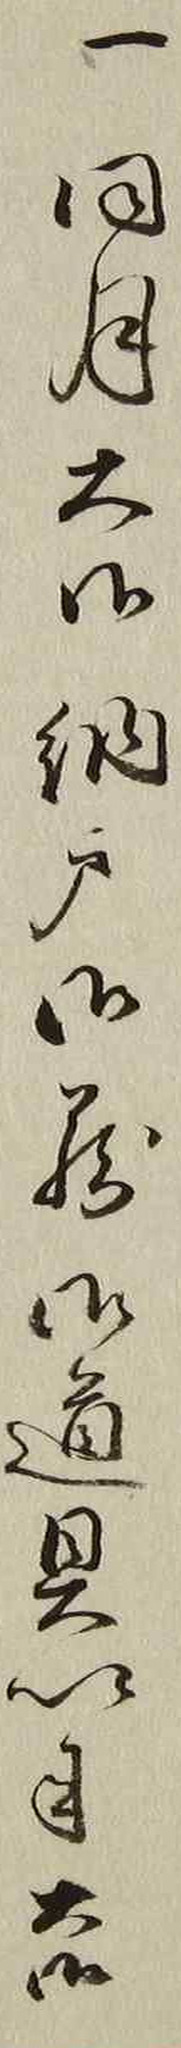一同月大御納戸御蔵御道具以来大御
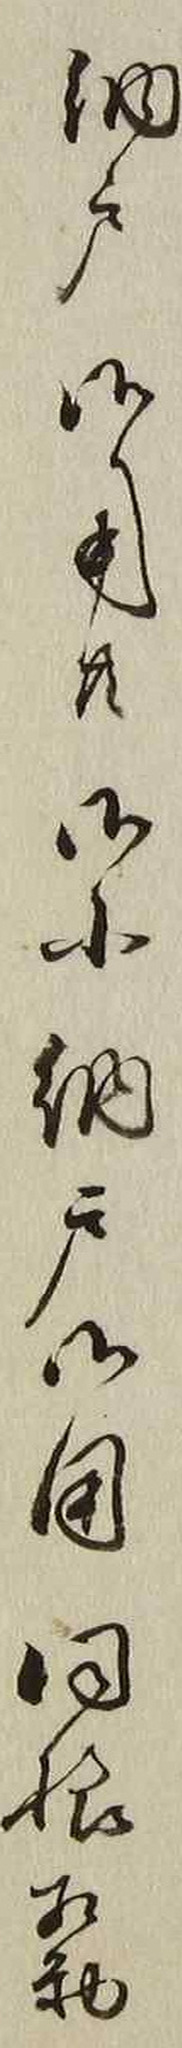納戸御用共御小納戸御用同様相勤
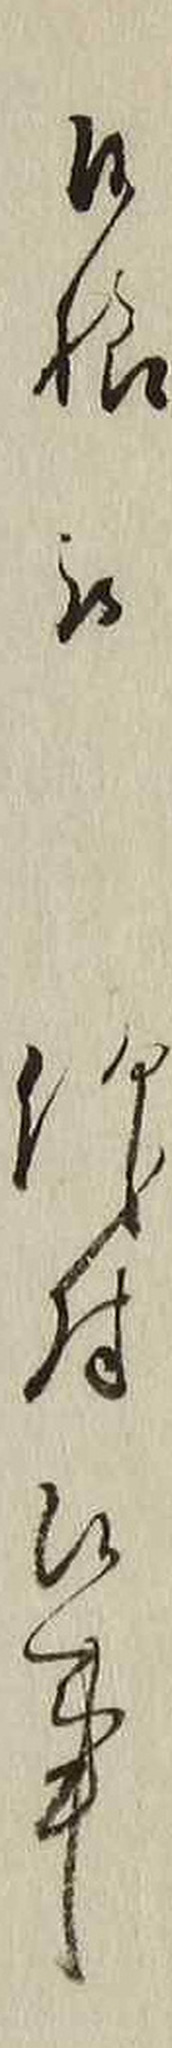候様被仰付候事
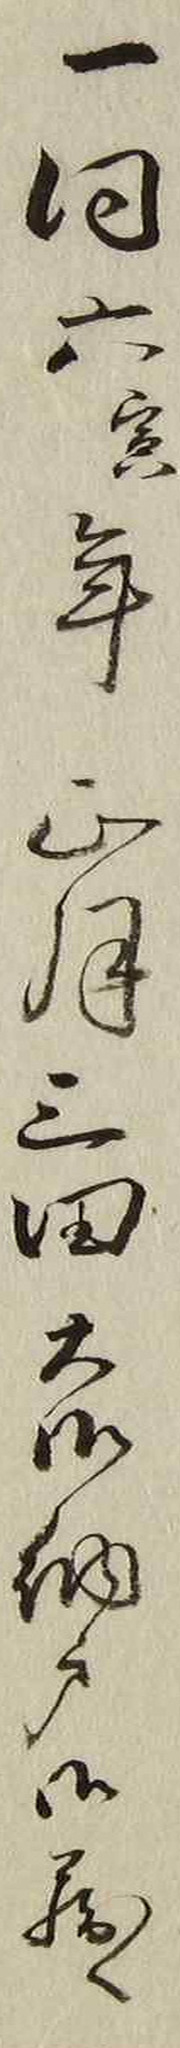一同六寅年正月三田大御納戸御蔵へ
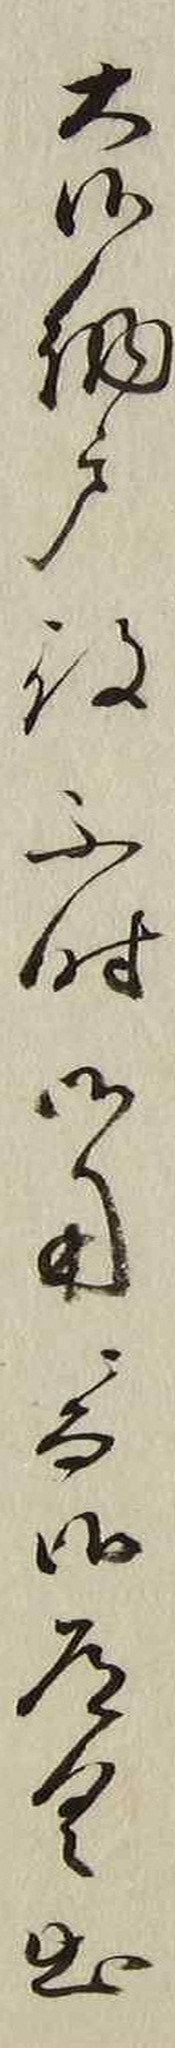大御納戸役不時御用ニ而御道具出
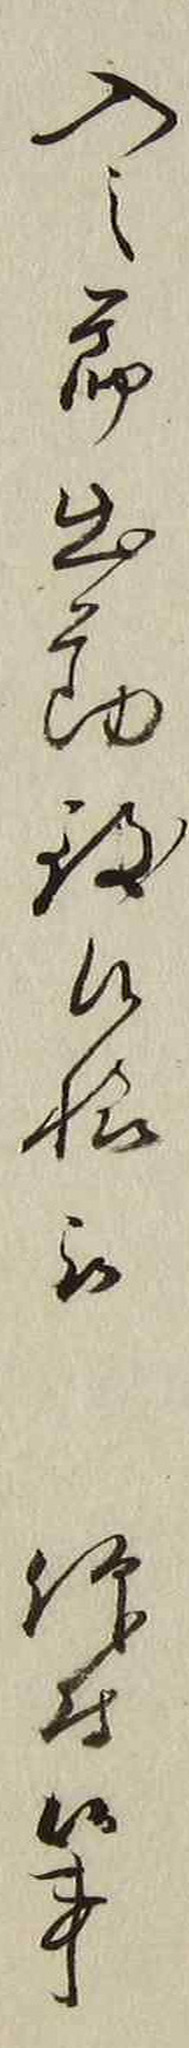入之節出勤致候様被仰付候事
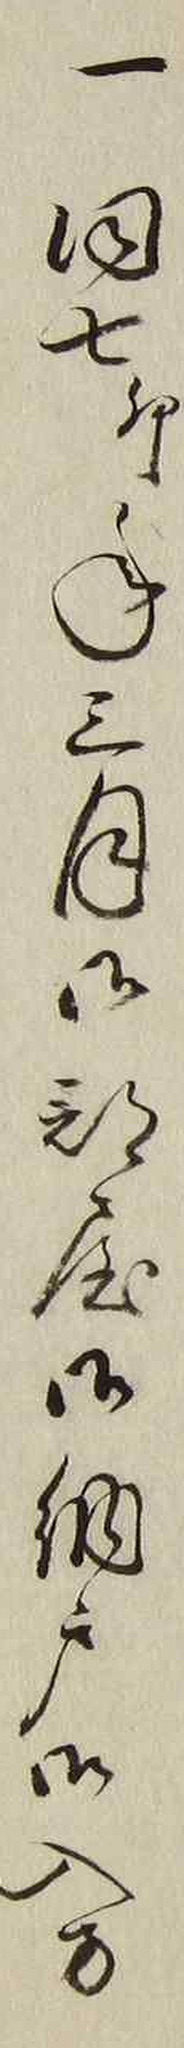一同七卯年三月御部屋御納戸御入方
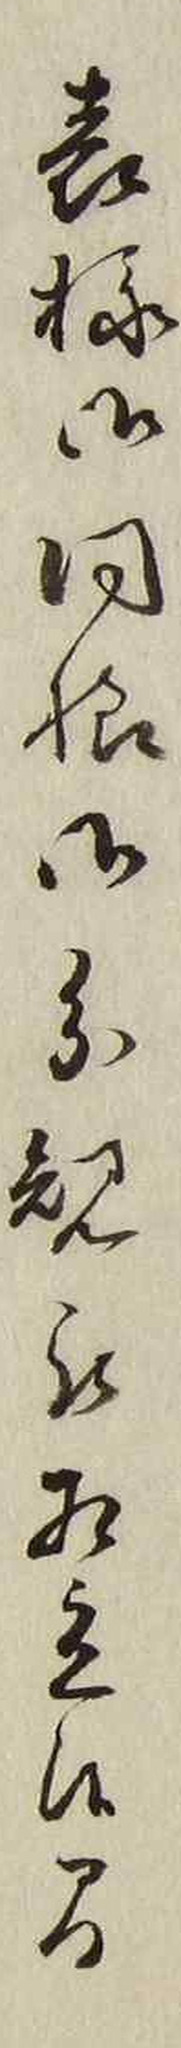表様御同様御分規被相立候間

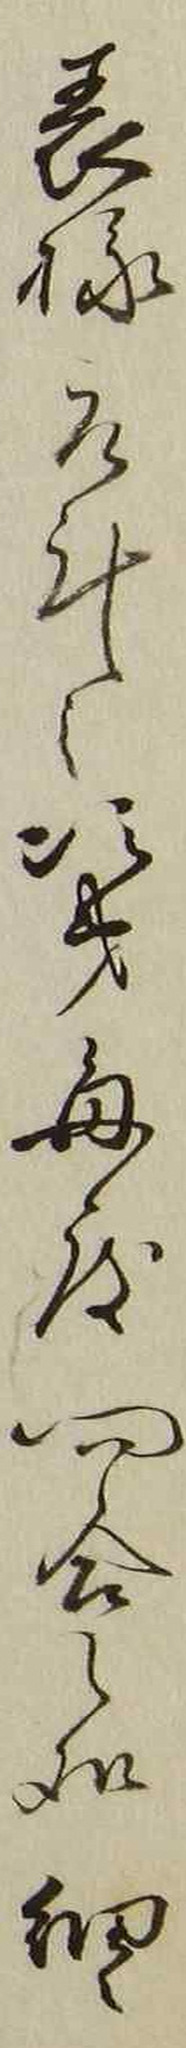表様取計之次第毎度問合候処細々
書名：諸士系譜　巻之4　い之部4
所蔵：会津若松市立会津図書館
